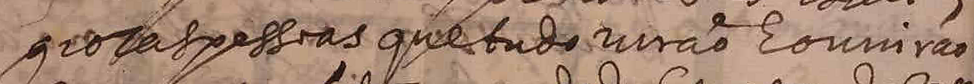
giozas pessoas que tudo uiraõ E ouuirão
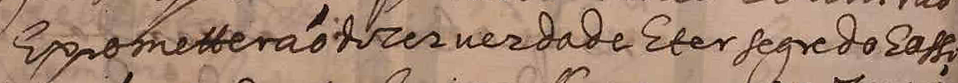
E prometteraõ dizer uerdade E ter segredo E assi
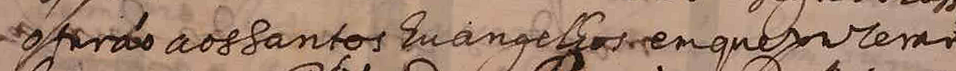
o foraõ aos Santos Euangelhos em que puzeraõ
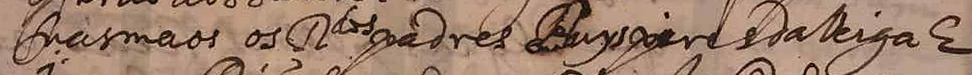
suas maos os Rdos padres Ruy pires da Veiga E
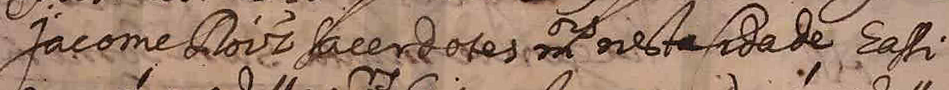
Jacome Roiz̄ sacerdotes mors nesta Cidade E assi
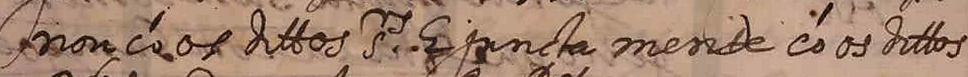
nou cō os dittos srs. E junctamente cō os dittos
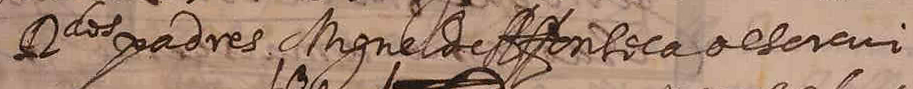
Rdos padres Miguel de Affonseca o escreui
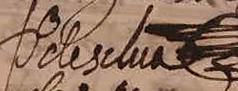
Po de silua
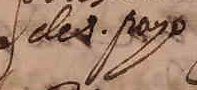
de s. payo
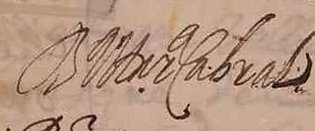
Bar txra Cabral
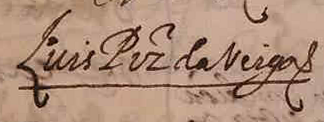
Luis Piz̄ da veiga
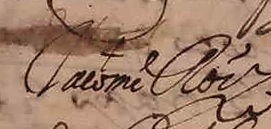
Iacome Roīz
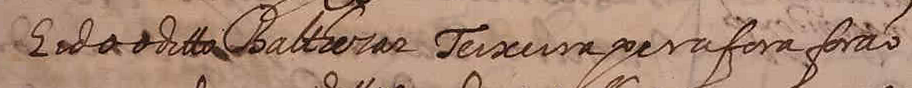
E ido o ditto Balthezar Teixeira pera fora foraõ
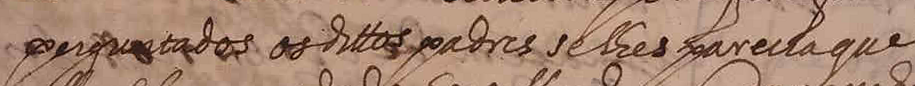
perguntados os dittos padres se lhes parecia que
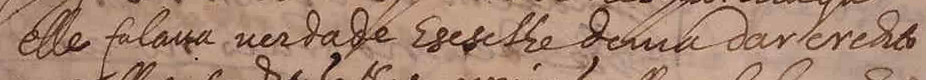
elle falaua uerdade E se se lhe deuia dar credito
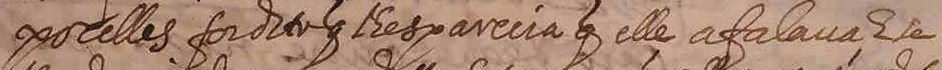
por elles foi dito q̄ lhes parecia q̄ elle a falaua E se
